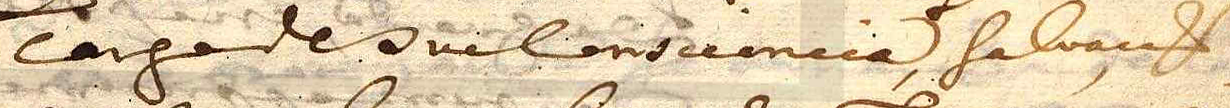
cargo de sua consciencia, salvaçaõ
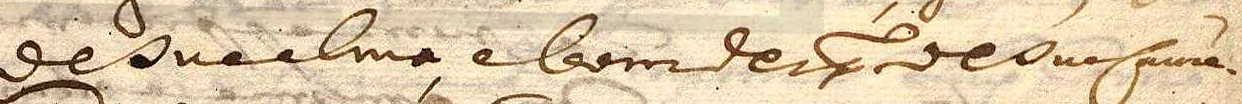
de sua alma e bom despo de sua Cauza?
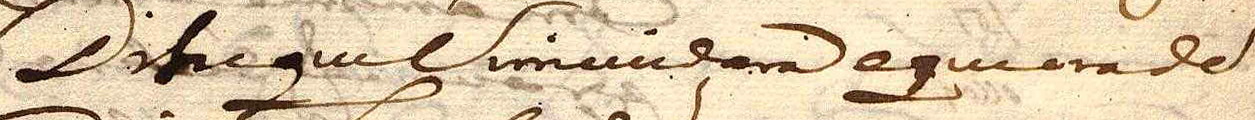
Disse que Sim cuidara e que era de
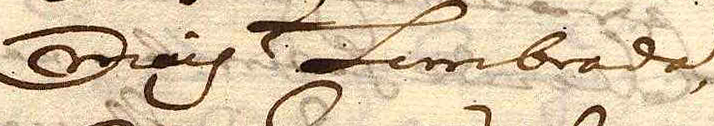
mais Lembrada,
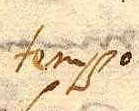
tempo
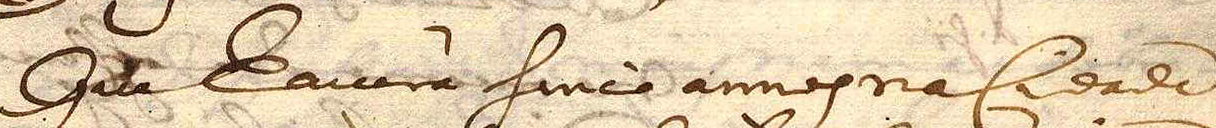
Que hauerá sinco annos na Cidade
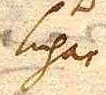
lugar
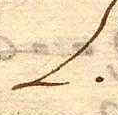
L.
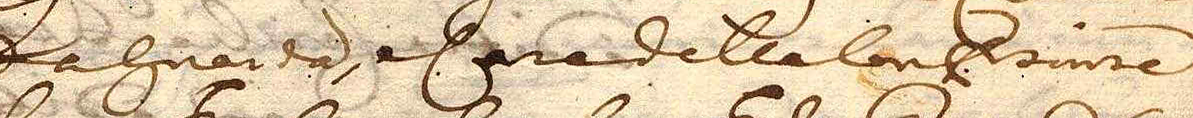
da Guarda, e Caza della Confitente
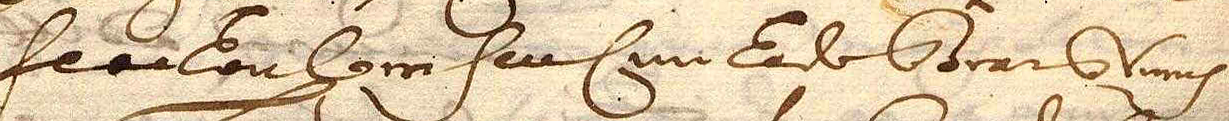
se achou Com seu Cunhado Braz Nunes
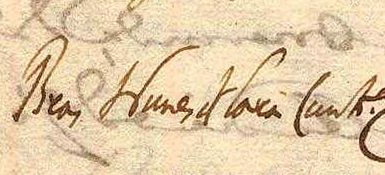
Bras Nunes de lara Cunh.o
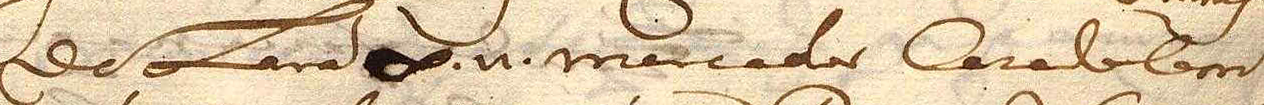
de Lara x. n. mercador Cazado Com
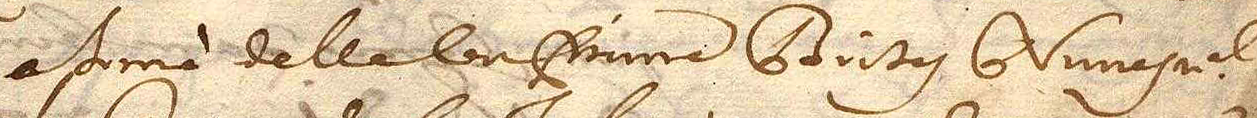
a Irmā della Confitente Brites Nunes n.al
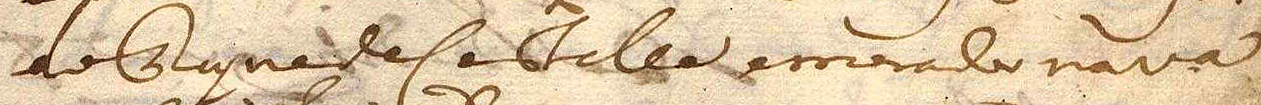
do Reyno de Castella e morador na v.a
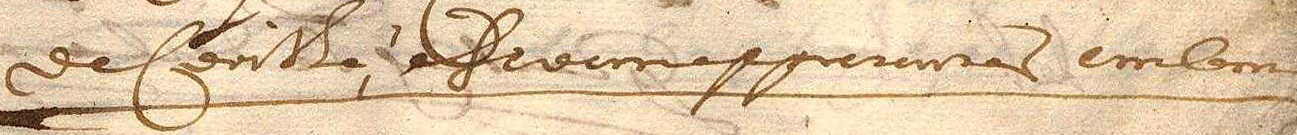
de Covilhã, e se vem apprezentar em Com
